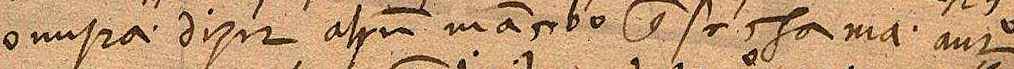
ouujra. dizer a hū māçebo q̄ se chama. anto
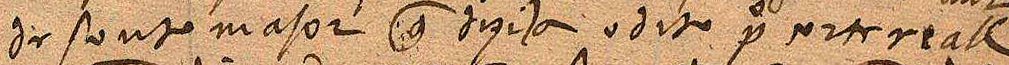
de soutomajor q̄ dizia o dito po corte reall
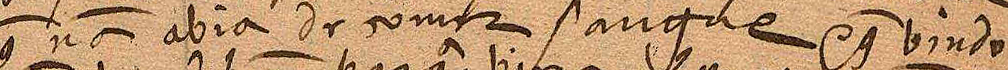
q̄ nā avia de comer sangue e q̄ vindo
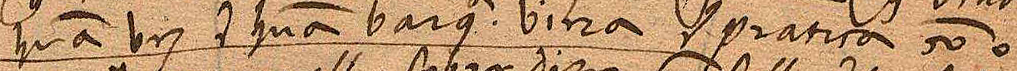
huā vez ē huā braqa. viera ē pratica c̄o o
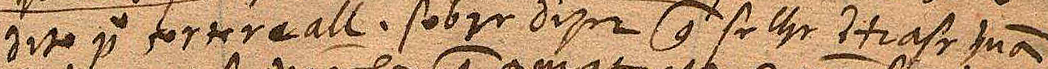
dito po corte reall. sobre dizer q̄ se lhe ētrase huā
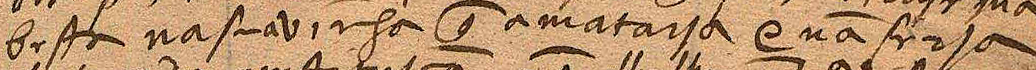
besta na sua vinha q̄ a matarja e nā serja
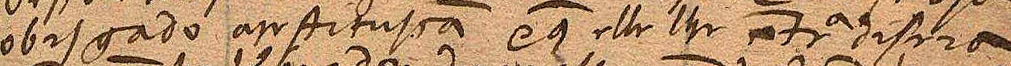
obrjgado a restitujcā e q̄ elle lhe cōtradisera
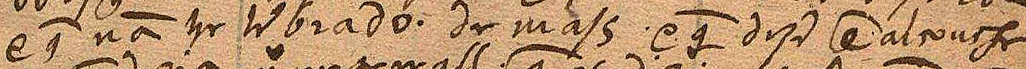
e q̄ nā he lēbrado. de majs e q̄ dizē ē alcouche
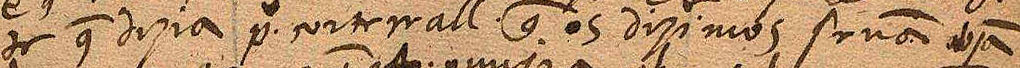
te q̄ dizia po. corte reall q̄ os dizimos se nā avjā
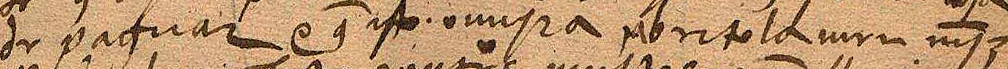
de paguar e q̄ isto. ouujra a bertolameu m̄jz
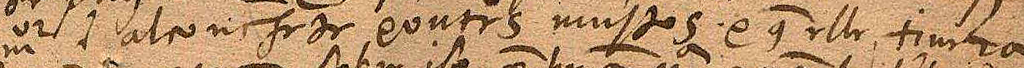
mor ē alcouchete e outros mujtos. e q̄ elle tiuera
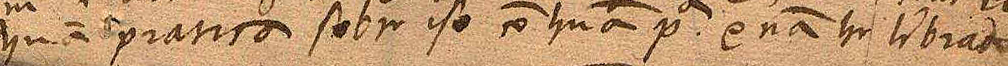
huā pratica sobre iso c̄o huā pa. e nā he lēbrado
